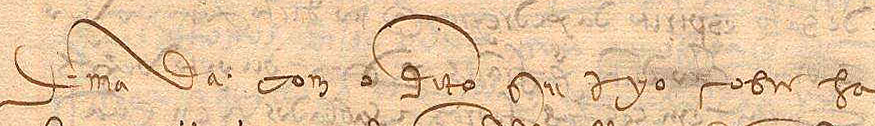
demāda com o d̄ito seu tyo sobre ha
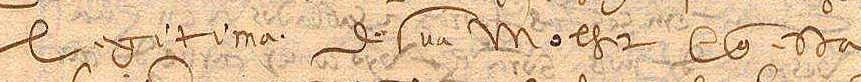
legitima de sua molher e q̄ esta
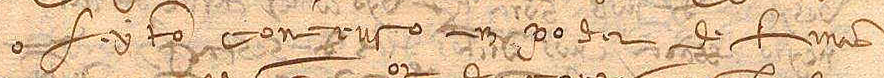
o feyto concruso em poder de fernaõ
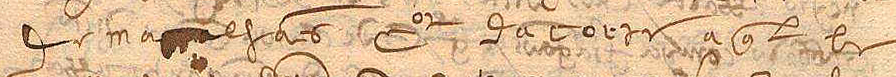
de magalhães Cor da corte a q̄L le
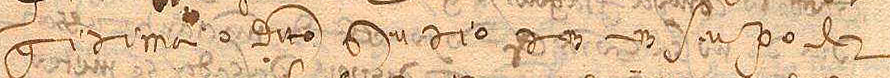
gitima o dīto seu tio tem em seu poder
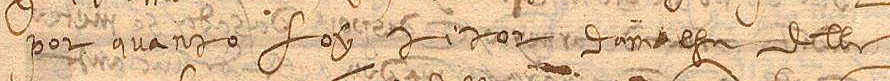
porquanto foy titor da molher delle
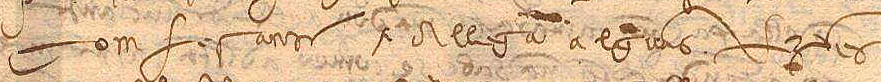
Comfesante e Allega alguās Rezoẽs
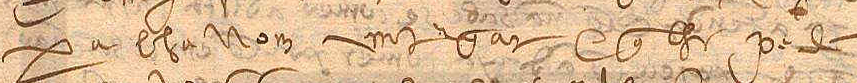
ꝑa lha nom emtregar e q̄ lhe pede
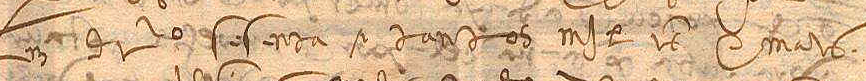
em drro sesenta e tantos mJl rs̄ e mais
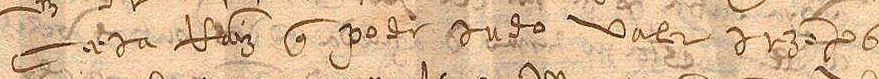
Certa Raīz q̄ pode tudo valer trezētos
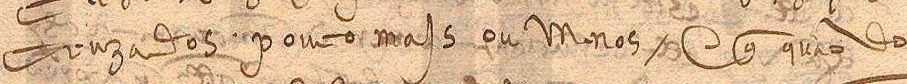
Cruzados pouco maJs ou menos / e q̄ quãodo
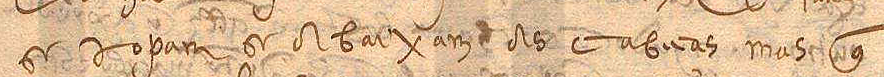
se topam se Abaixam As cabeças mas q̄
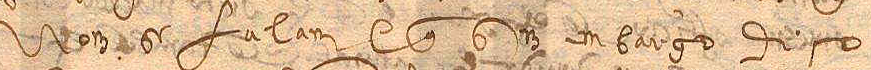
Nom se falam e q̄ sem embargo diso
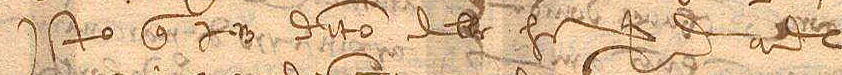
Jsto q̄ tem dīto delle he ꝟdade
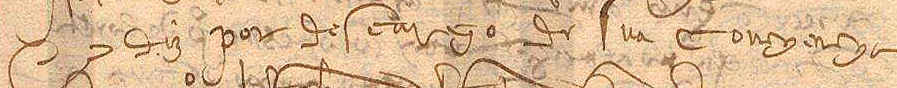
e o diz por descargo de sua concyencya
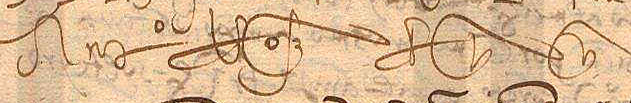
Anto RōJz o stp̄vy
